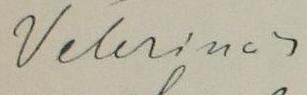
Veterinär
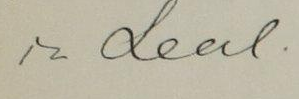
in Leal
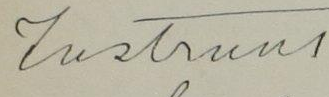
Instrukt
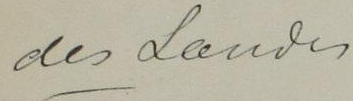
des landes
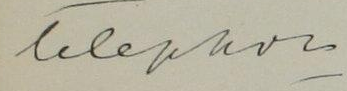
telephon
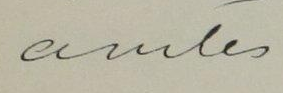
amtes
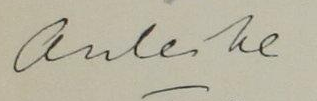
Anleihe
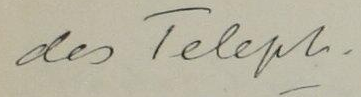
des Teleph.
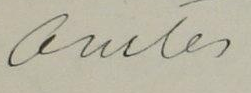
Amtes
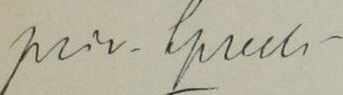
priv. Sprech
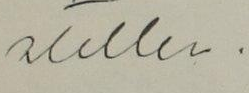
steller
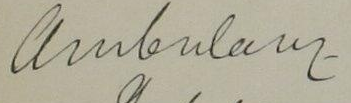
Ambulanz
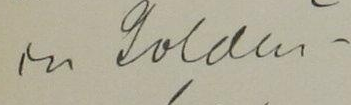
in Golden
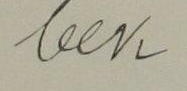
bek
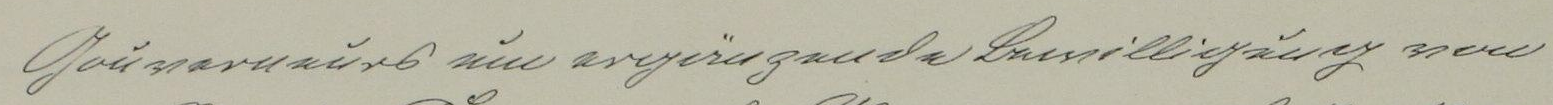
Gouverneurs um ergänzende Bewilligung von
